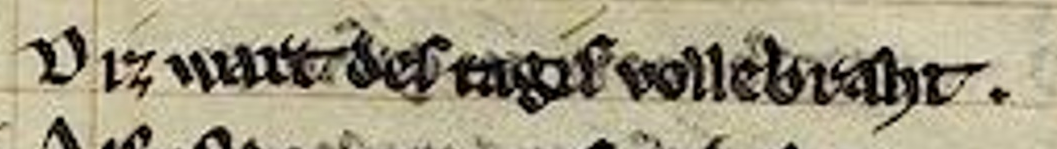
Diz wart deſ tagiſ vollebraht.
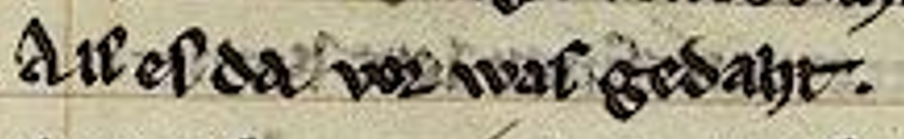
Alſ eſ da vor waſ gedaht.
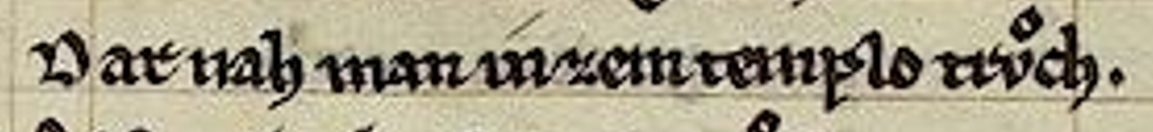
Dar nah man in zem templo trv°och.
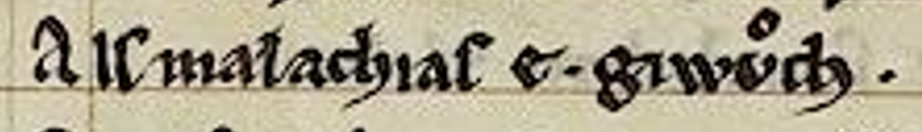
Alſ malachiaſ e. giwv°och.
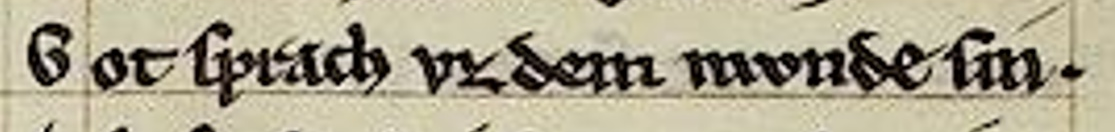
Got ſprach vz dem mvnde ſin.
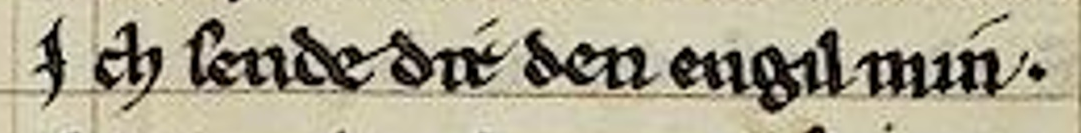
Ich ſende dir den engil min.
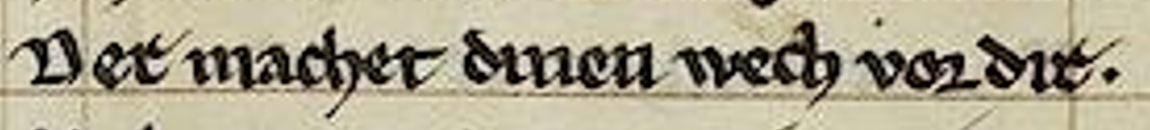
Der machet dinen wech vor dir.
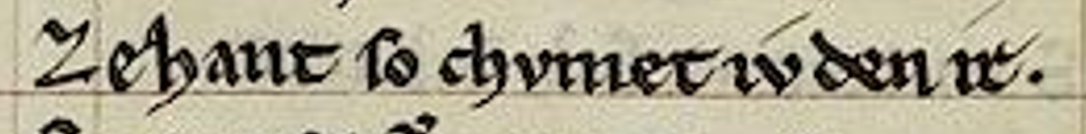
Zehant ſo chvmet iv den ir.
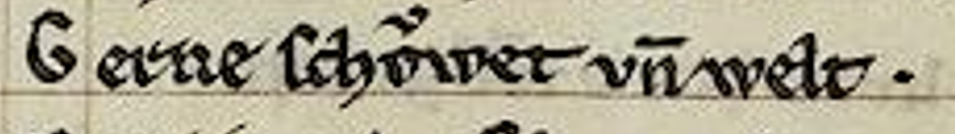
Gerne ſcho°vwet vn(d) welt.
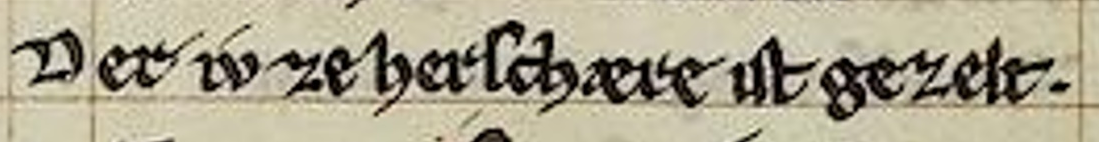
Der iv ze herſch[ae]re iſt gezelt.
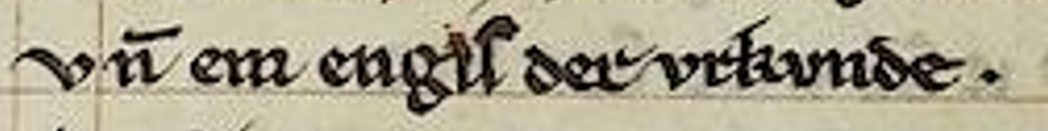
Vn(d) ein engiſ der vrkvnde.
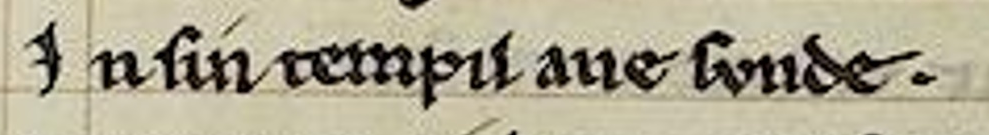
In ſin tempil ane ſvnde.
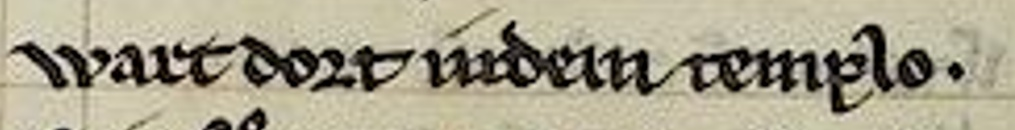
wart dort indein templo.
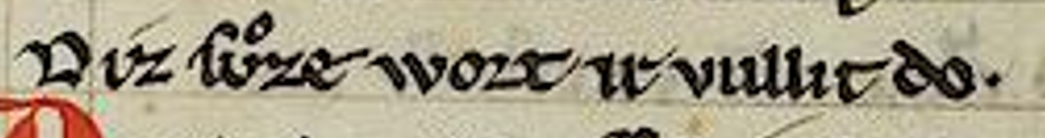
Diz ſv°oze wort ir vullit do.
